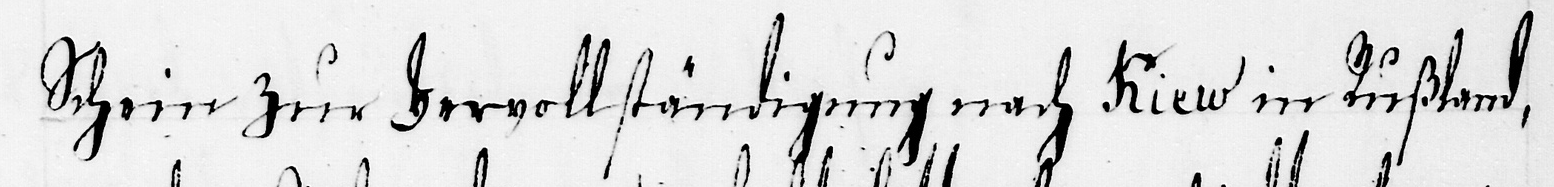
Schein zur Vervollständigung nach Kiew in Rußland,
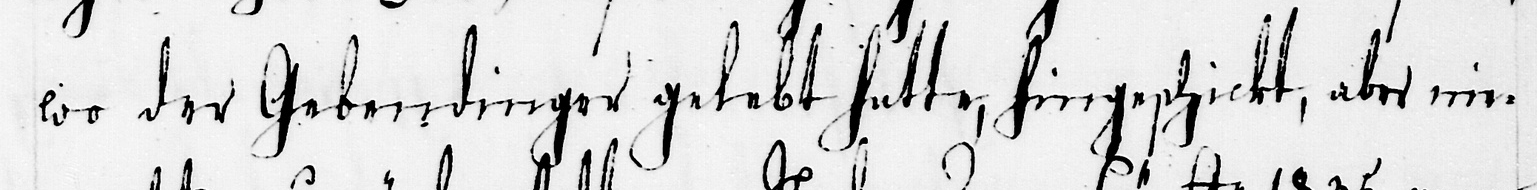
wo der Gebendinger gelebt hatte, hingeschickt, aber nie¬
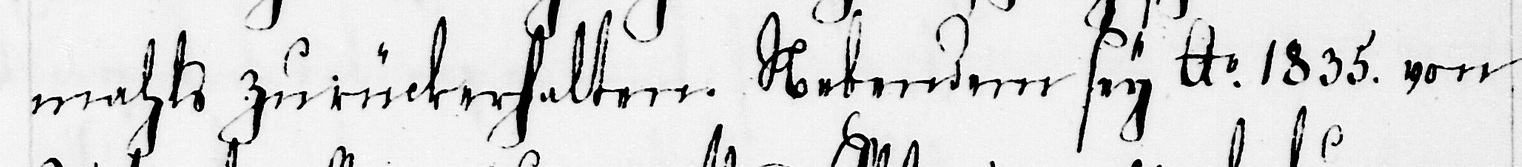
mahls zurückerhalten. Nebendem sey Ao. 1835. von
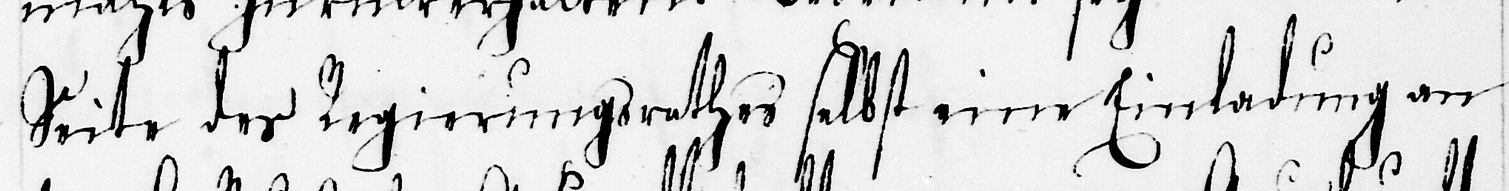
Seite des Regierungsrathes selbst eine Einladung an
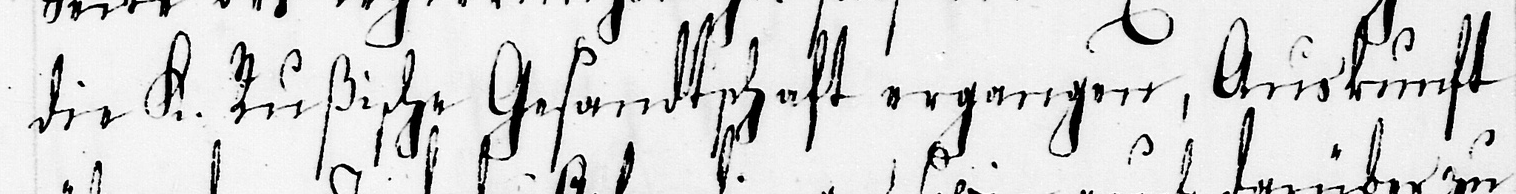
die K. Rußische Gesandtschaft ergangen, Auskunft
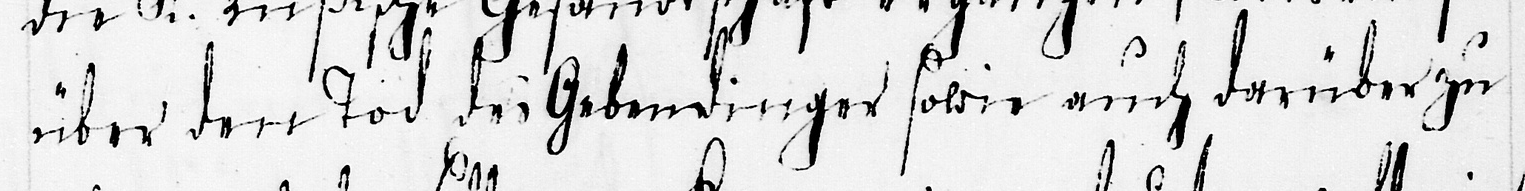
über den Tod des Gebendinger sowie auch darüber zu
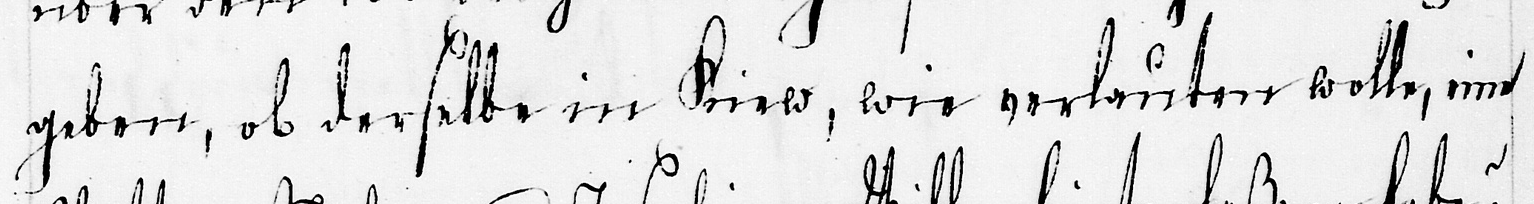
geben, ob derselbe in Kiew, wie verlauten wolle, eine
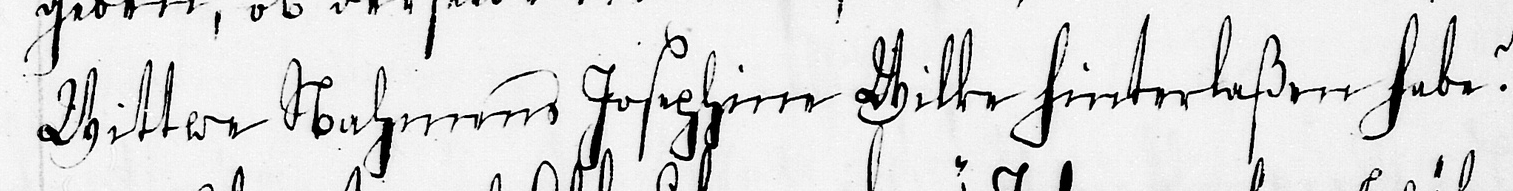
Wittwe Nahmens Josephine Wilke hinterlaßen habe?
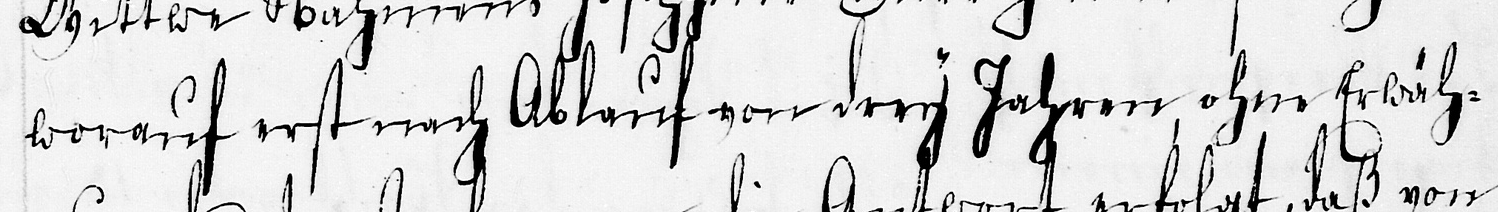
worauf erst nach Ablauf von drey Jahren, ohne Erwäh¬
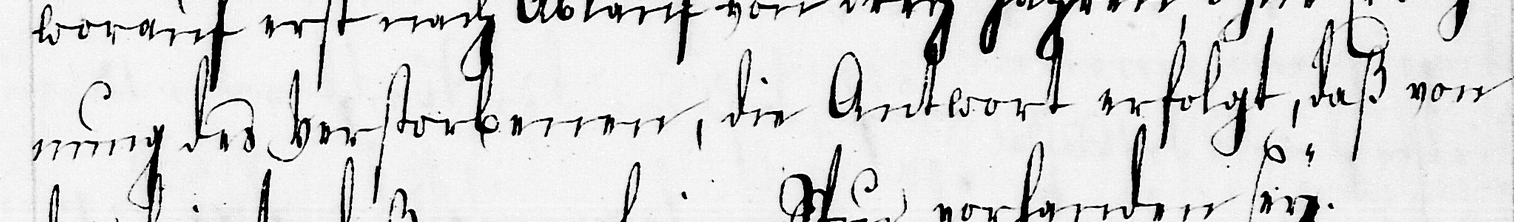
nung des Verstorbenen, die Antwort erfolgt, daß von
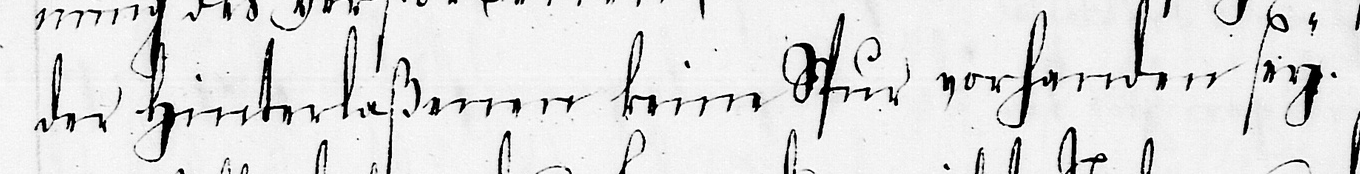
der Hinterlaßenen keine Spur vorhanden sey.
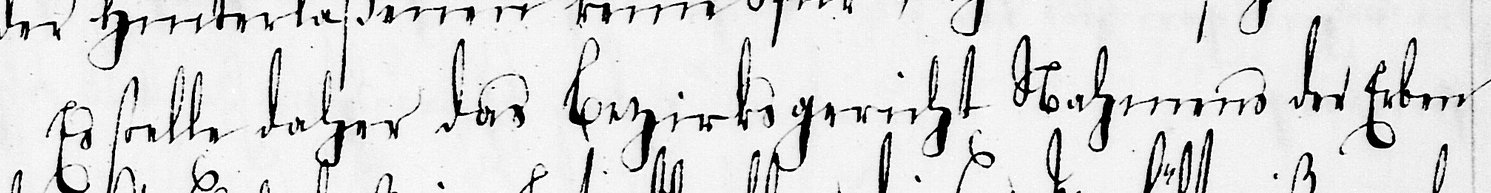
Es stelle daher das Bezirksgericht Nahmens der Erben
